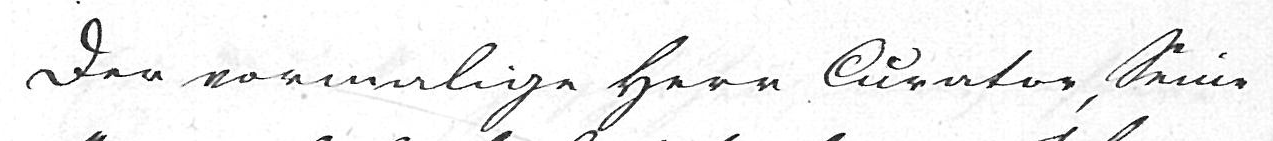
Der vormalige Herr Curator, Seine
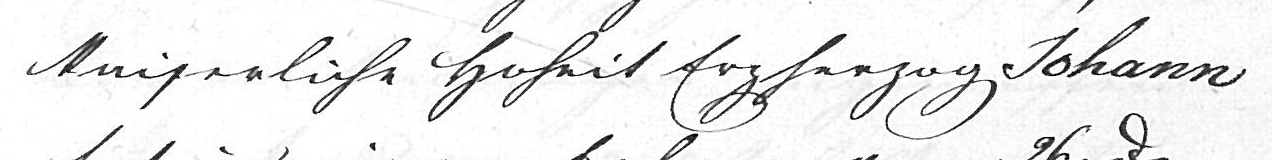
kaiserliche Hoheit Erzherzog Johann
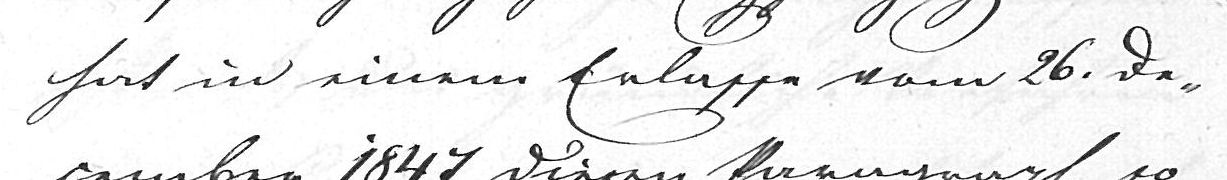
hat in einem Erlasse vom 26. De-
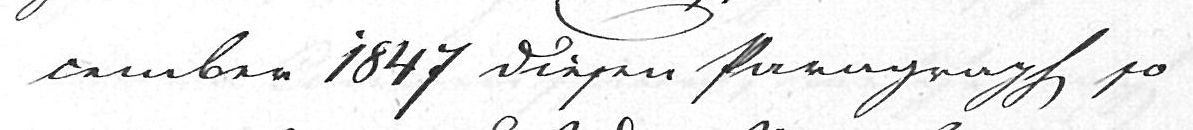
cember 1847 diesen Paragraph so
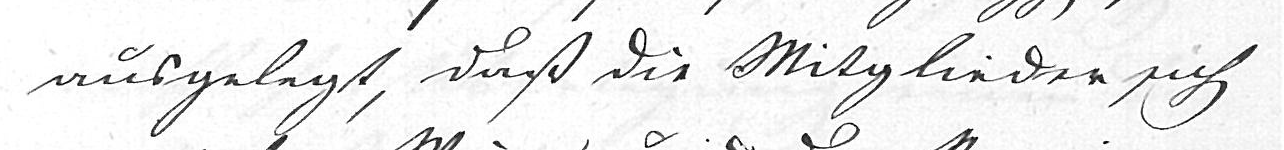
ausgelegt, daß die Mitglieder sich
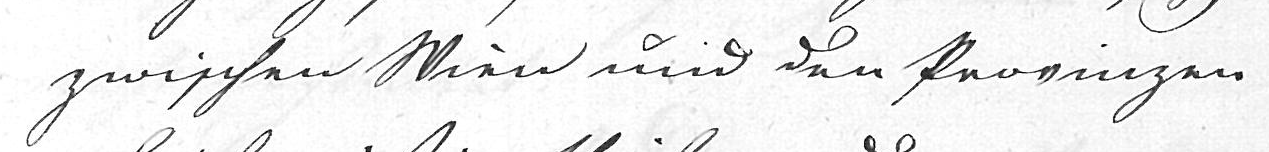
zwischen Wien und den Prorinzen
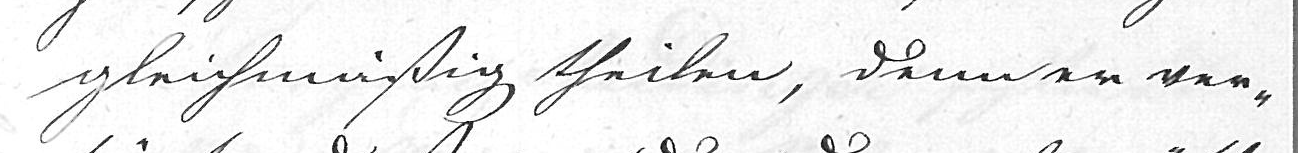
gleichmißig theilen, denn er ver-
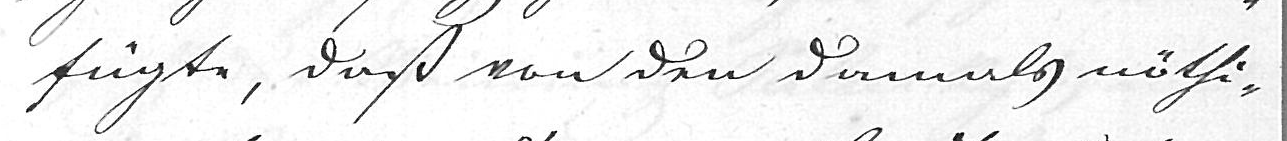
fügte, daß von den damals nöthi-
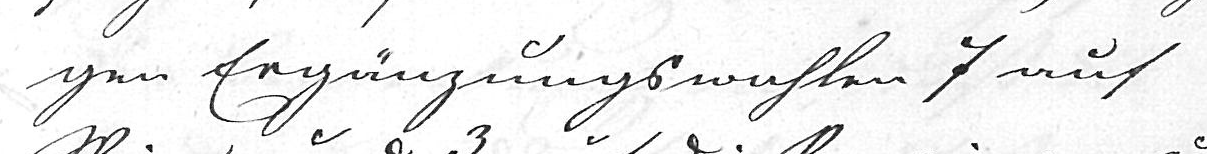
gen Ergänzungswahlen 7 auf
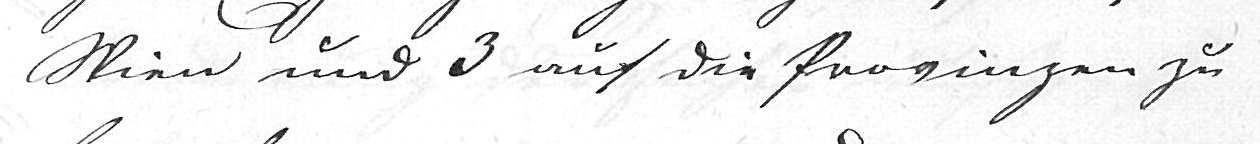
Wien und 3 auf die Proginzen zu
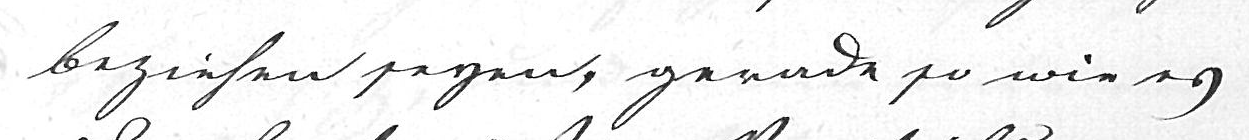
beziehen seyen, gerade so wie es
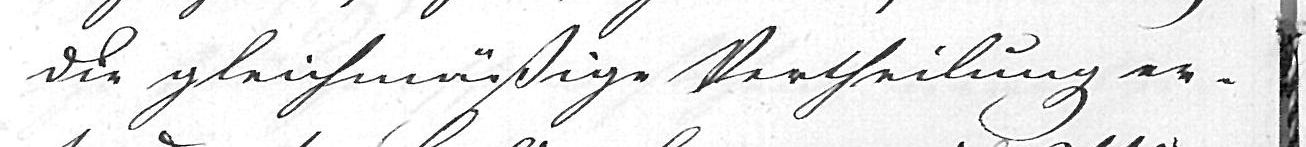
die gleichmäßige Vertheilung er-
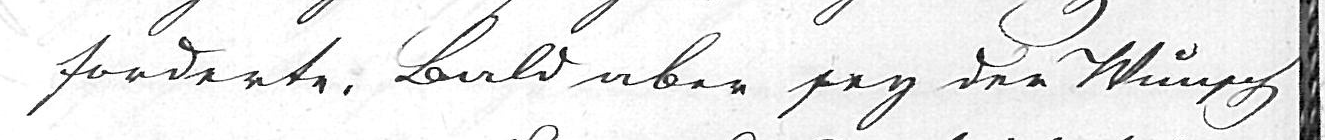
forderte. Bald aber sey der Wunsch
